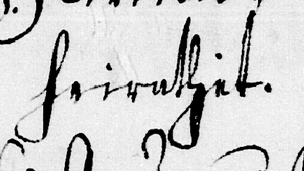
heirathet.
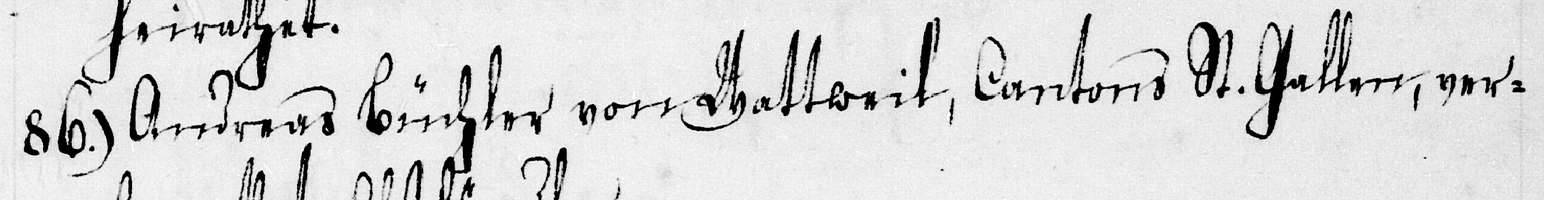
86.) Andreas Büchler von Wattweil, Cantons St. Gallen, ver¬
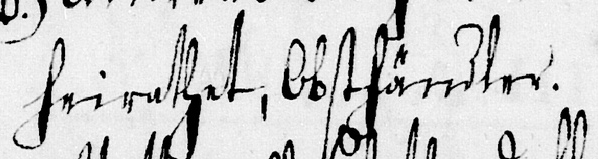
heirathet, Obsthändler.
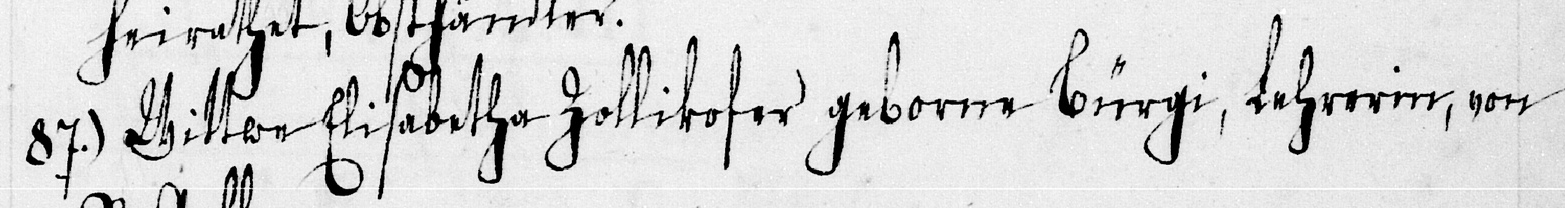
87.) Wittwe Elisabetha Zollikofer geborne Bürgi, Lehrerin, von
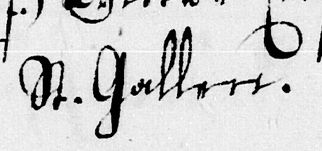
St. Gallen.
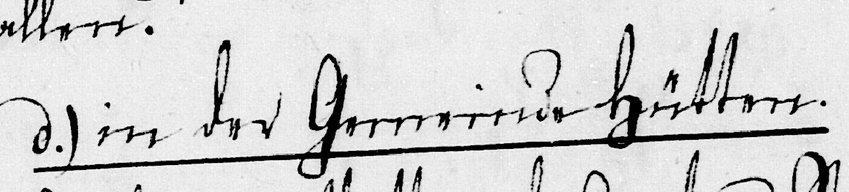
d.) in der Gemeinde Hütten.
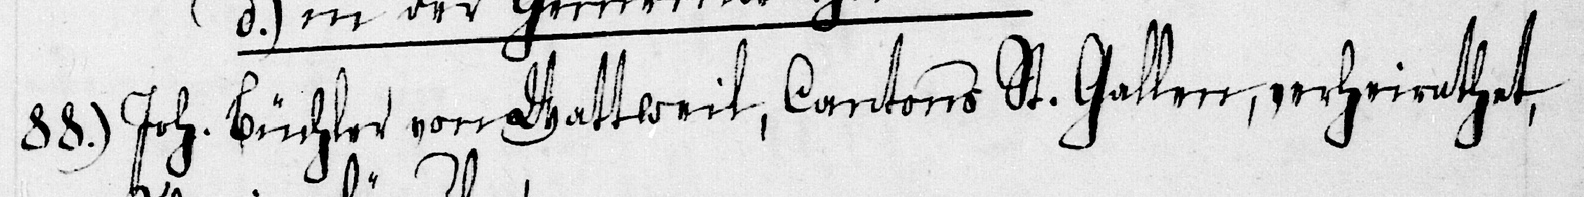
88.) Joh. Büchler von Wattwil, Cantons St. Gallen, verheirathet,
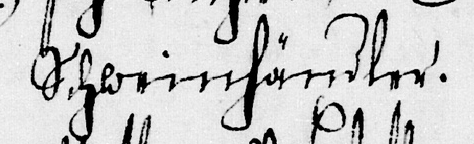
Schweinhändler.
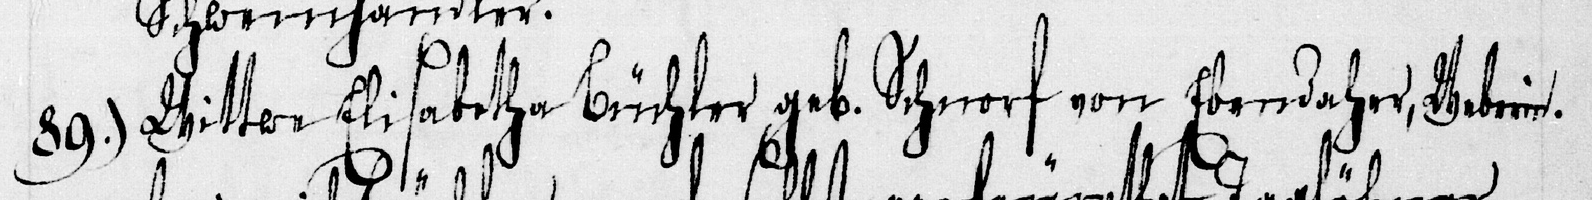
89.) Wittwe Elisabetha Büchler geb. Schnorf von Ebendaher, Weberin.
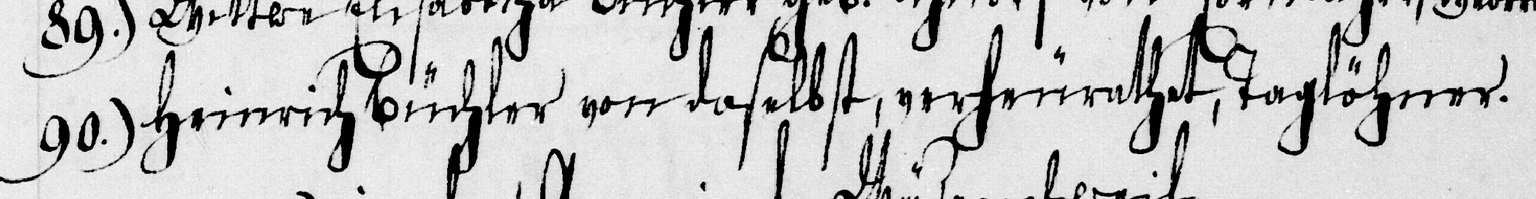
90.) Heinrich Büchler von daselbst, verheurathet, Taglöhner.
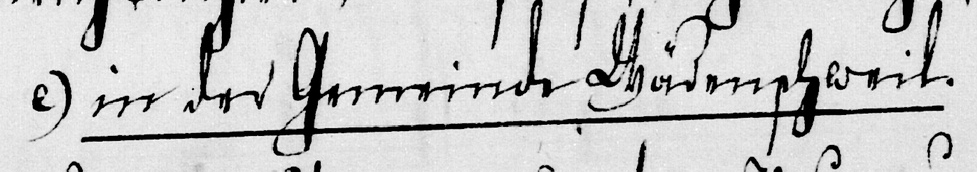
e.) in der Gemeinde Wädenschweil.
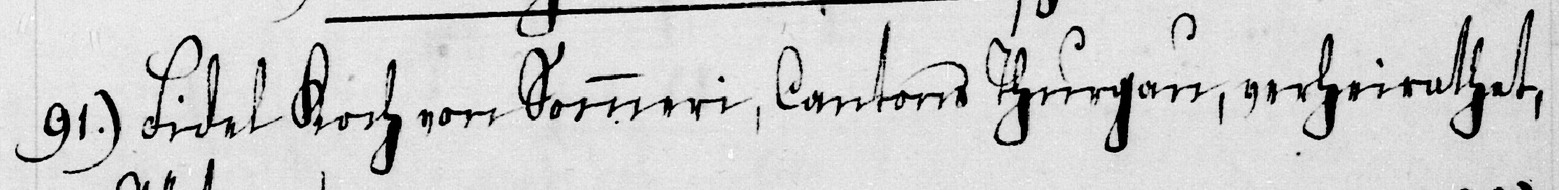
91.) Fidel Koch von Sommeri, Cantons Thurgau, verheirathet,
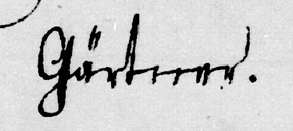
Gärtner.
